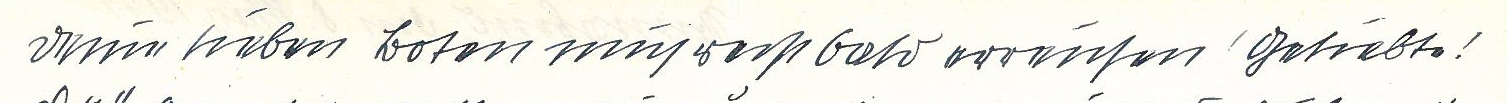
deine lieben Boten mich recht bald erreichen, Geliebte!
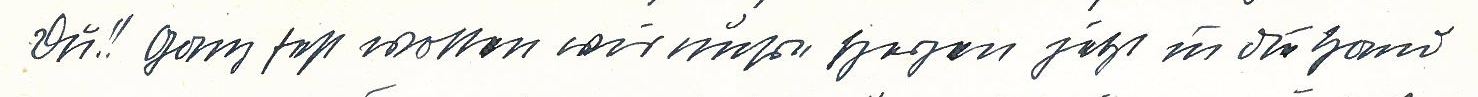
Du!! Ganz fest wollen wir unsre Herzen jetzt in die Hand
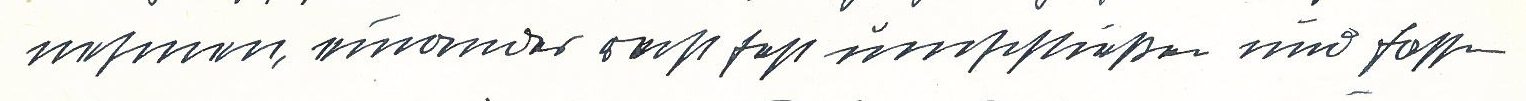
nehmen, einander recht fest umschließen, und hoffen
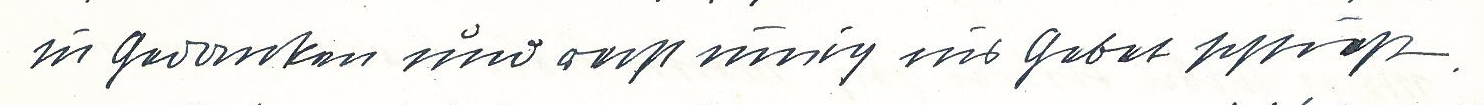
in Gedanken und recht innig ins Gebet vertieft!
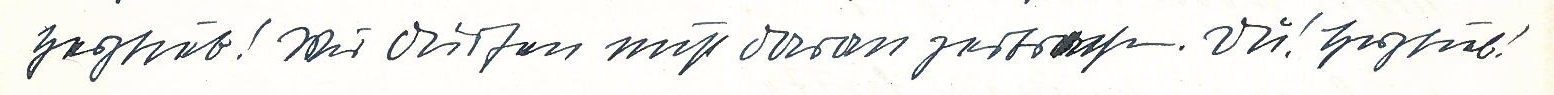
Herzlieb! Wir dürfen nicht daran zerbrechen. Du! Herzlieb!
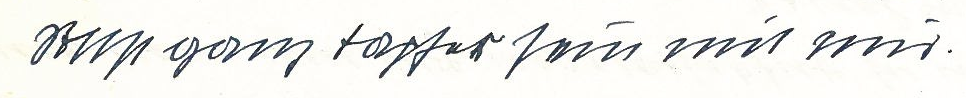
Musst ganz tapfer sein mit mir.
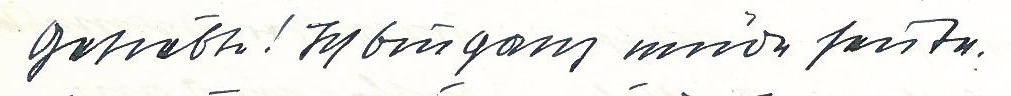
Geliebte! Ich bin ganz müde heute.
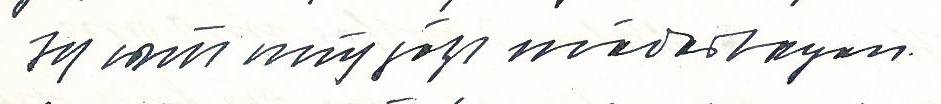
Ich muss mich jetzt niederlegen.
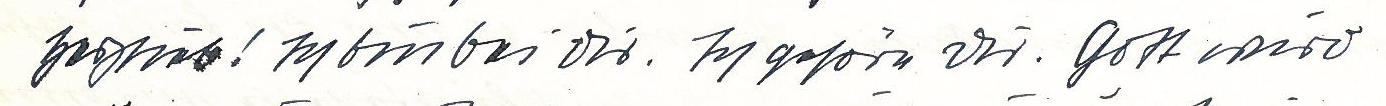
Herzlieb! Ich bin bei Dir. Ich gehöre Dir. Gott wird
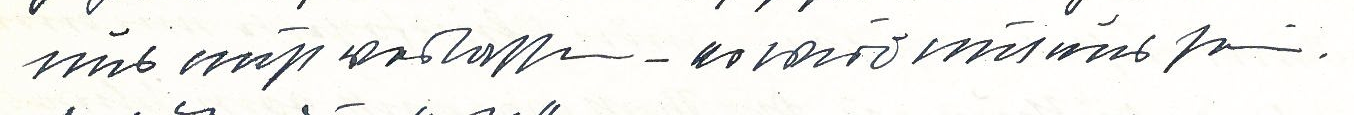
uns nicht verlassen – er wird mit uns sein.
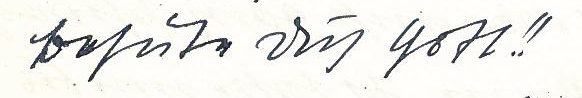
Behüte Dich Gott!!
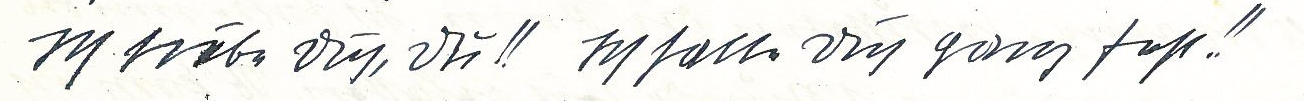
Ich liebe Dich, Du!! Ich halte Dich ganz fest!!
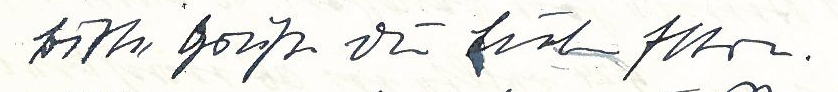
Bitte, grüße die lieben Eltern.
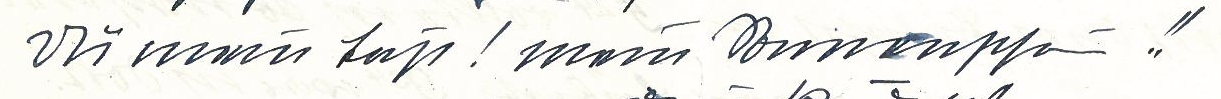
Du mein Licht! Mein Sonnenschein!!
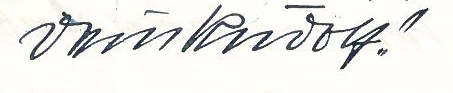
Dein !!
